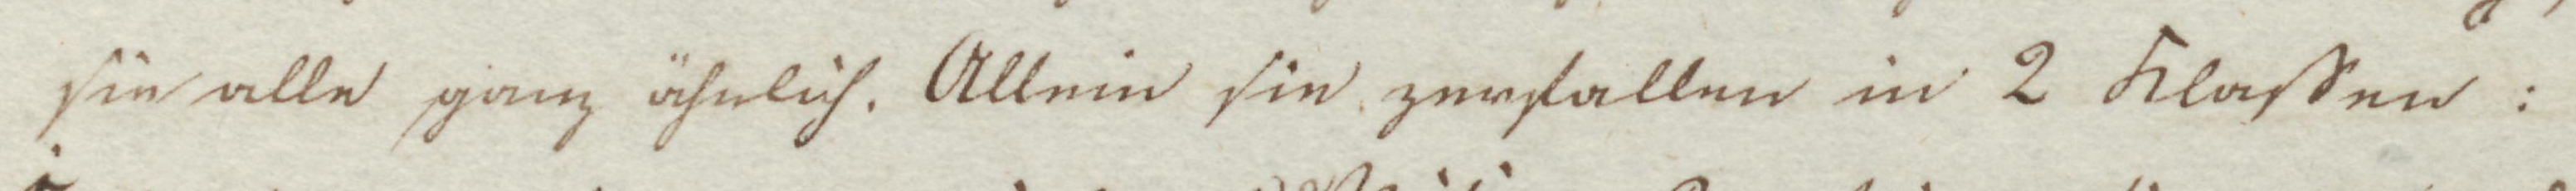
sie alle ganz ähnlich. Allein sie zerfallen in 2 Klassen:
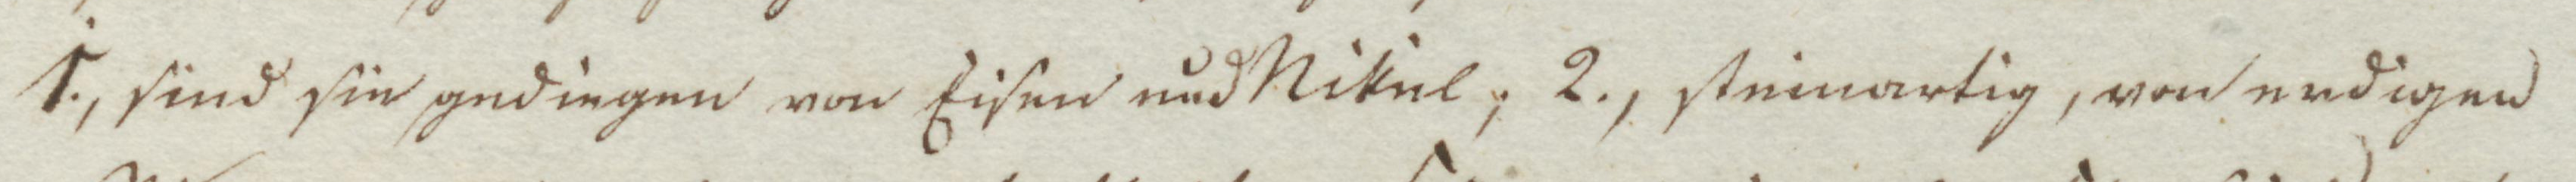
1., sind sie gediegen von Eisen und Nickel; 2., steinartig, von erdigen
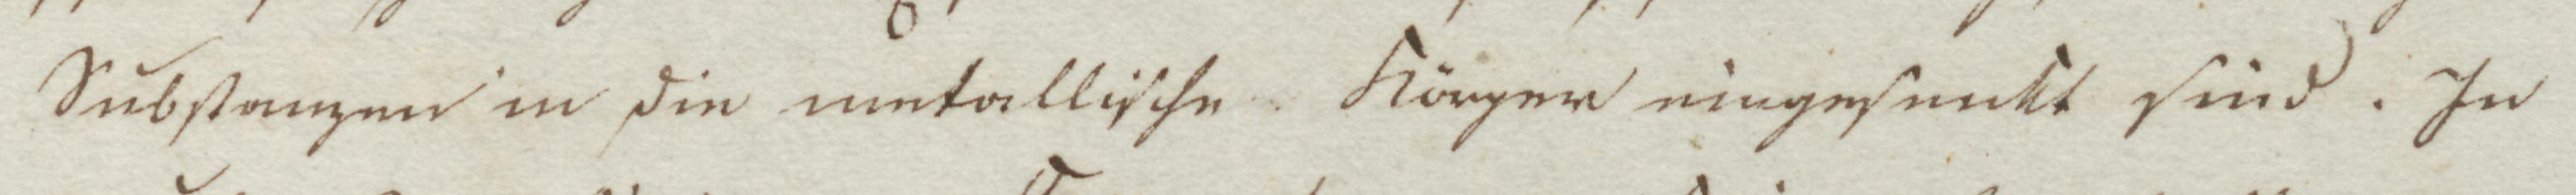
Substanzen in die metallischen Körper eingesenkt sind. In
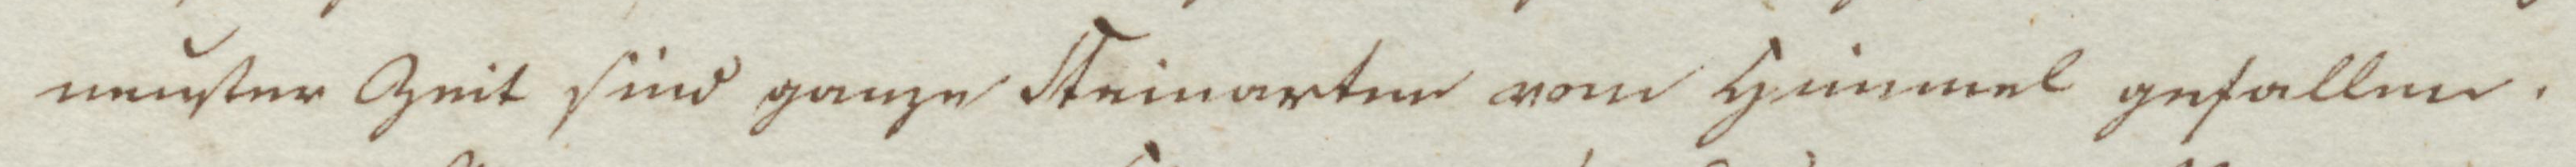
neuster Zeit sind ganze Steinarten vom Himmel gefallen,
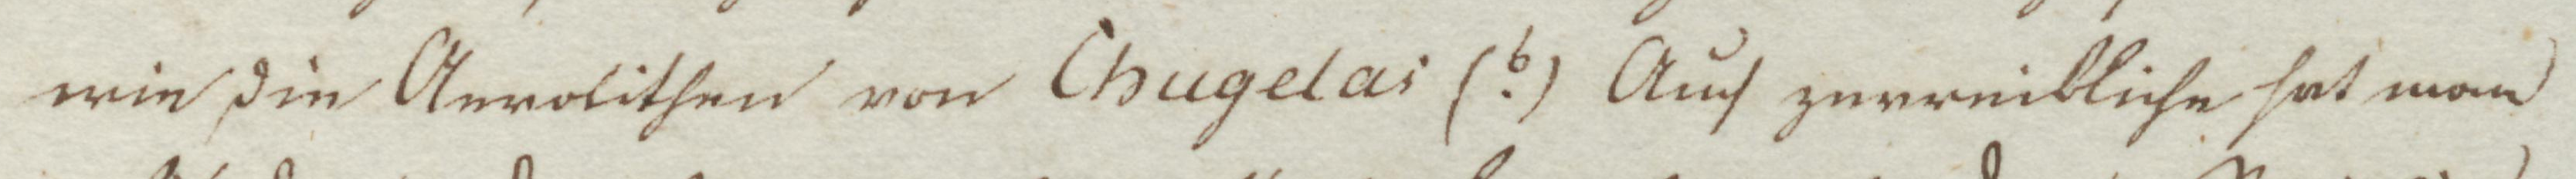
wie die Aerolithen von Chugelas Auch zerreibliche hat man
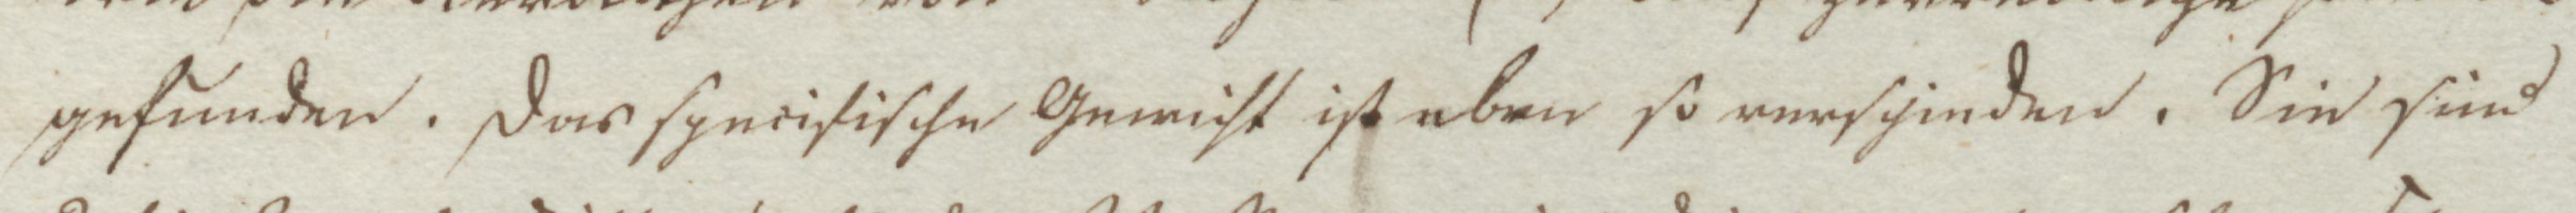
gefunden. Das specifische Gewicht ist eben so verschieden. Sie sind
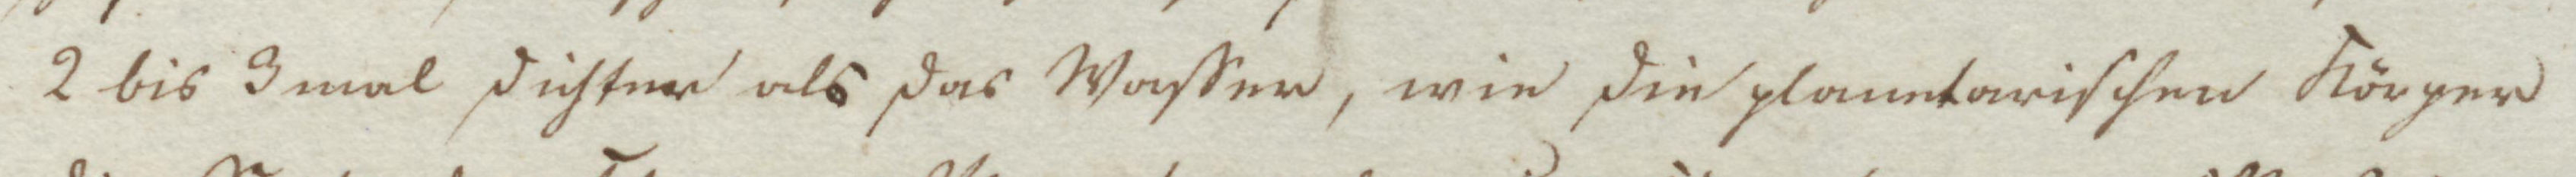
2 bis 3 mal dichter als das Wasser, wie die planetarischen Körper
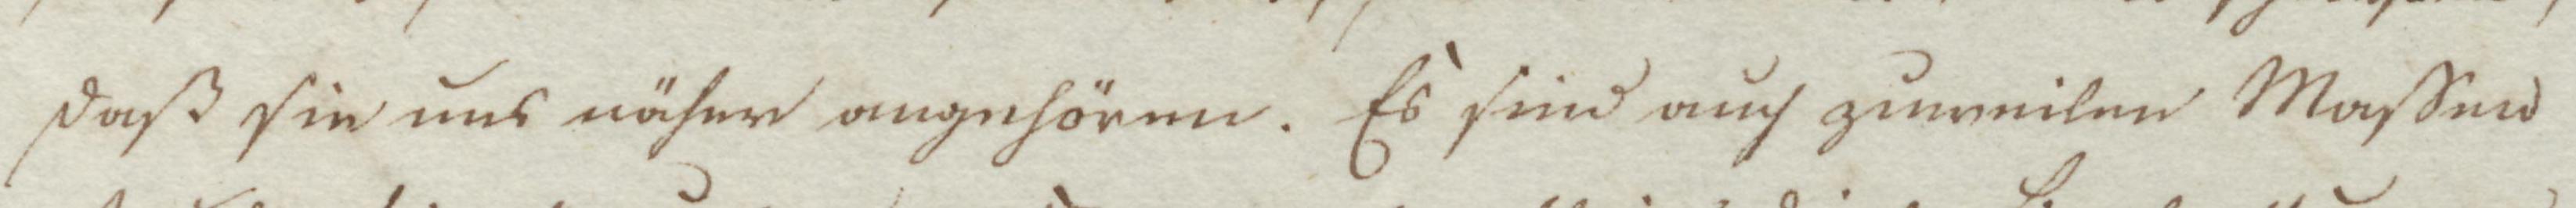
daß sie uns näher angehören. Es sind auch zuweilen Massen
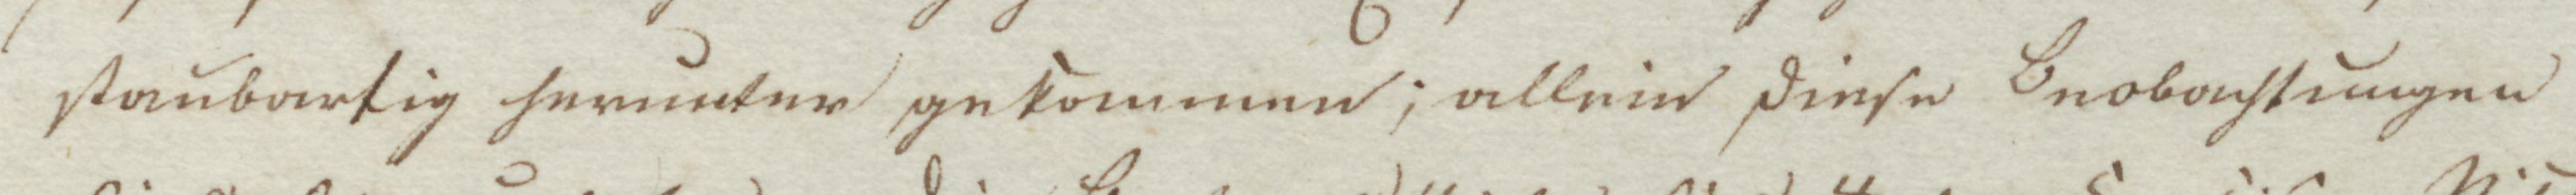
staubartig herunter gekommen; allein diese Beobachtungen
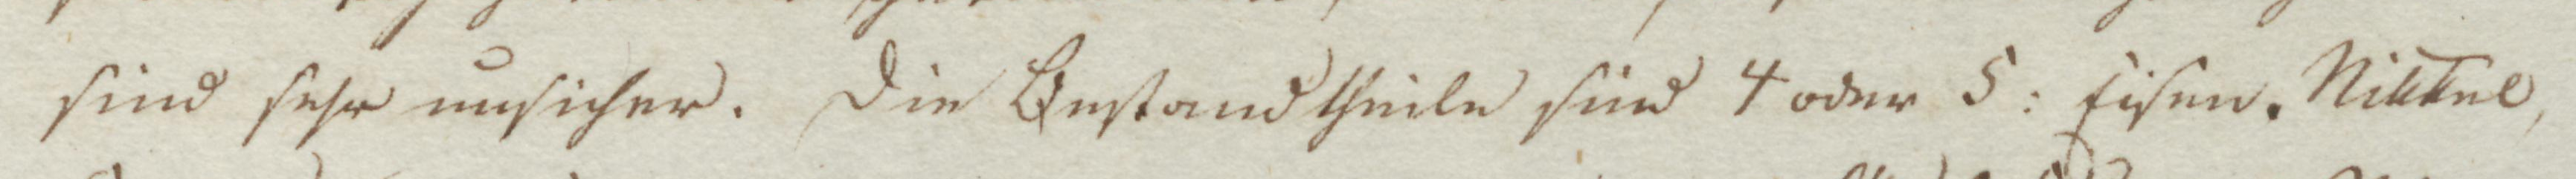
sind sehr unsicher. Die Bestandtheile sind 4 oder 5: Eisen Nikkel,
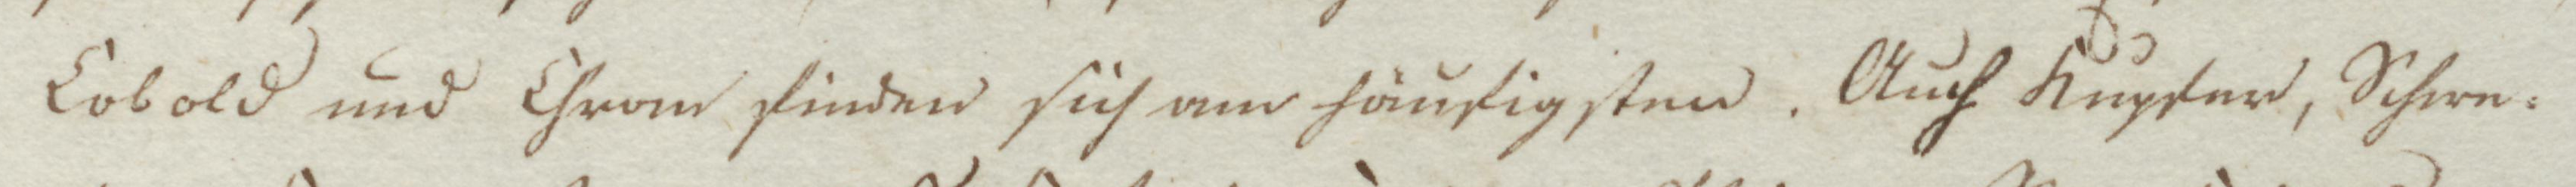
Cobold und Chrom finden sich am häufigsten. Auch Kupfer, Schwe-
